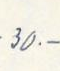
30
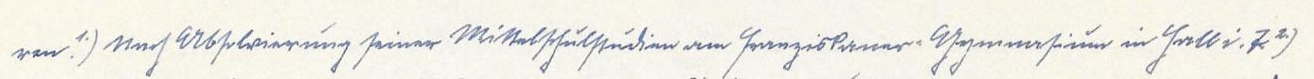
ren. 1) Nach Absolvierung seiner Mittelschulstudien am Franziskanergymnasium in Hall i. T. 2)
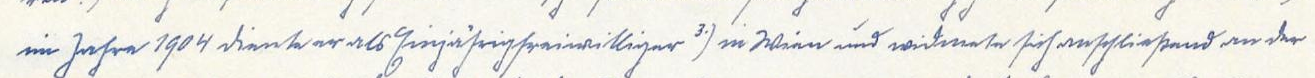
im Jahre 1904 diente er als Einjährigfreiwilliger in Wien und widmete sich anschließend an der
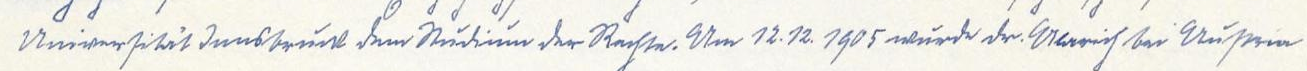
Universität Innsbruck dem Studium der Rechte. Am 12.12.1905 wurde Dr. Alarich bei Austria
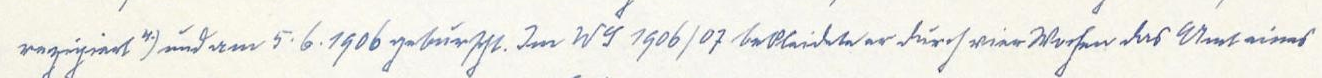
rezipiert 4) und am 5.6.1906 geburscht. Im WS 1906/1907 bekleidete er doch vier Wochen das Amt eines
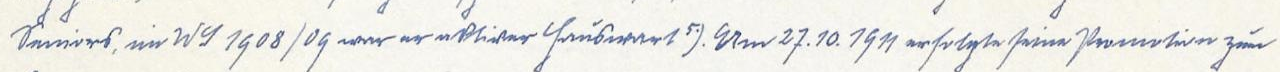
Seniors, im WS 1908/09 war er aktiver Hauswart. 5) Am 27.10.1911 erfolgte seine Promotion zum
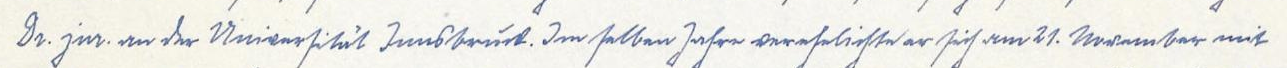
Dr. jur. an der Universität Innsbruck. Im selben Jahre verehelichte er sich am 21. November mit
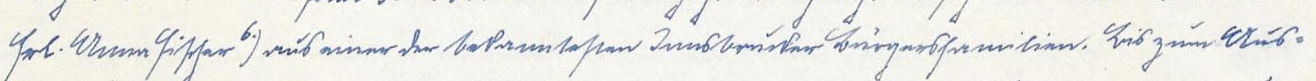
Frl. Anna Fischer 6) aus einer der bekanntesten Innsbrucker Bürgersfamilien. Bis zum Aus-
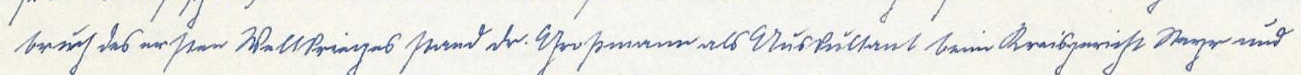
bruch des ersten Weltkrieges stand Dr. Großmann als Auskultant beim Kreisgericht Steyr und
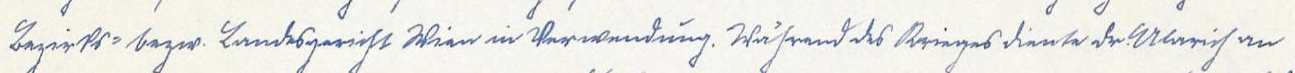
Bezirks- bzw. Landesgericht Wien in Verwendung. Während des Krieges diente Dr. Alarich an
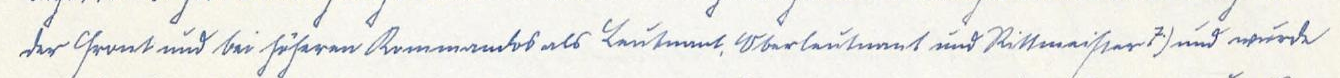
der Front und bei höheren Kommandos als Leutnant, Oberleutnant und Rittmeister und wurde
